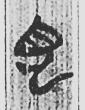見
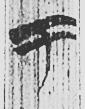于
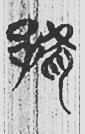{邑寽虎}
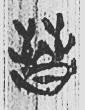晉
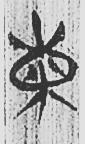柬
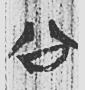公
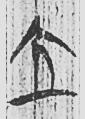立
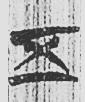五
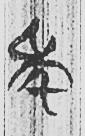年
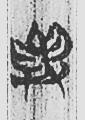與
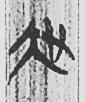吳
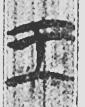王
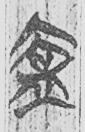盍
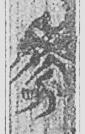{虎力}
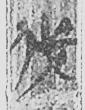伐
